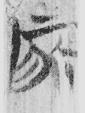所
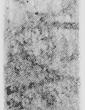亟
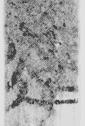勞
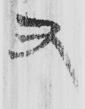又
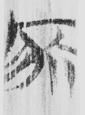所
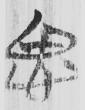思
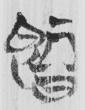{食几日}
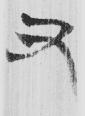又
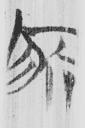所
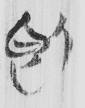飤
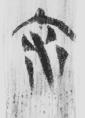罙
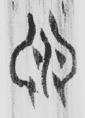𣶒
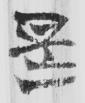是
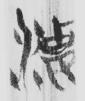淒
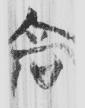高
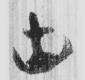山
